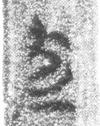室
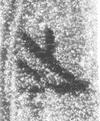之
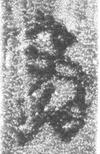器
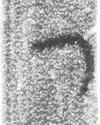一
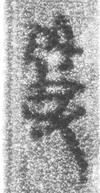笲
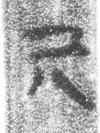亓（其）
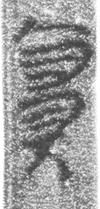實
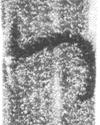一
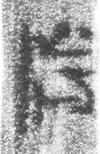○（浣）
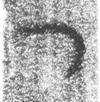一
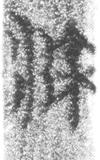浍（沬）
